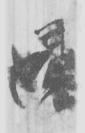婦
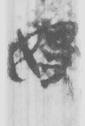婢
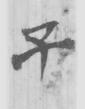子
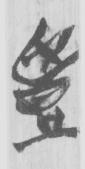{臣豆}
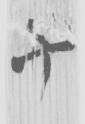子
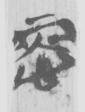{丙心}
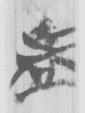者
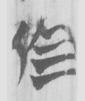於
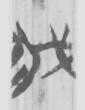我
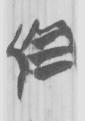於
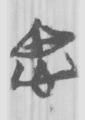思
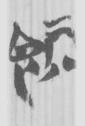飢
